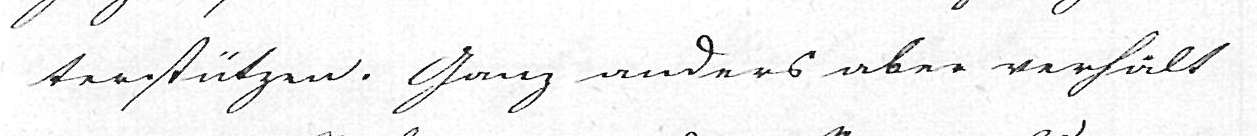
terstützen. Ganz anders aber verhält
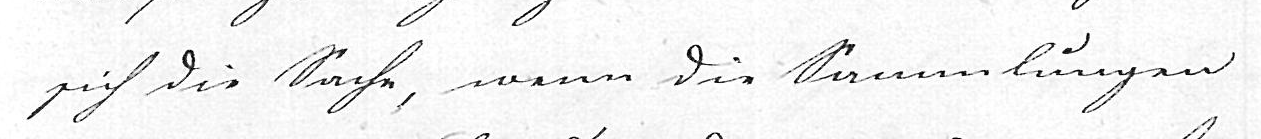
sich die Sache, wenn die Sammlungen
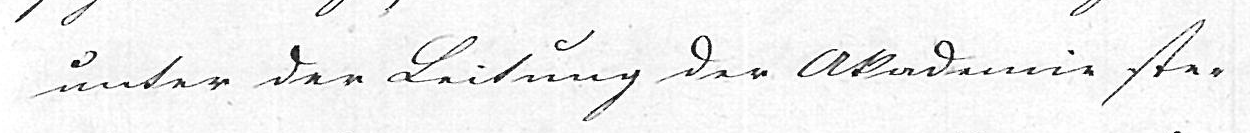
unter der Leitung der Akademie ste-
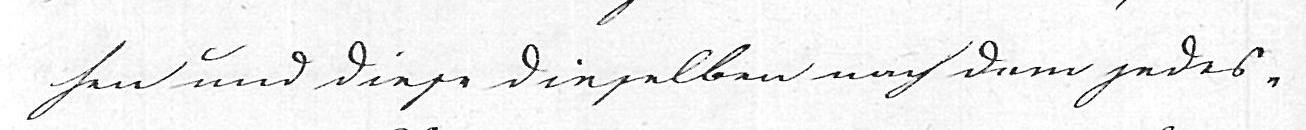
hen und diese dieselben nach dem jedes-
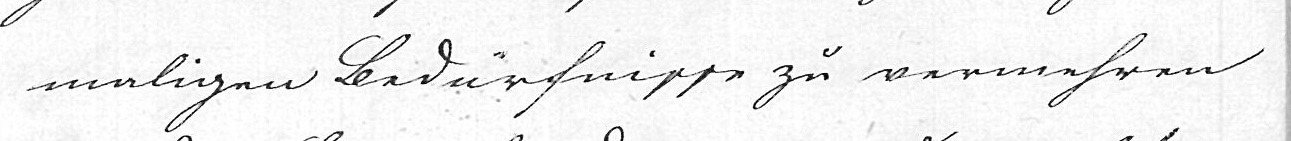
maligen Bedürfnisse zu vermehren
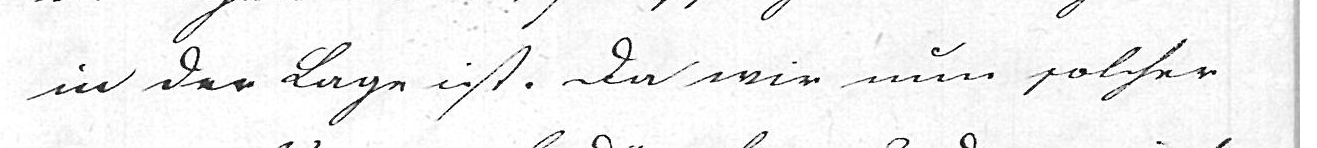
in der Lage ist. Da wir nun solcher
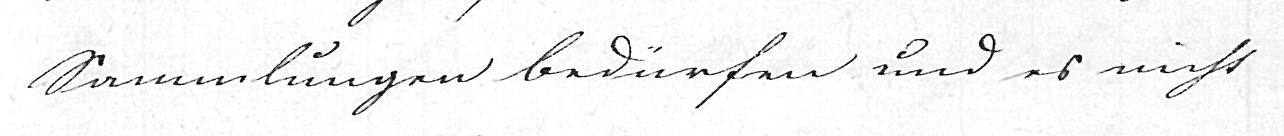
Sammlungen bedürfen und es nicht
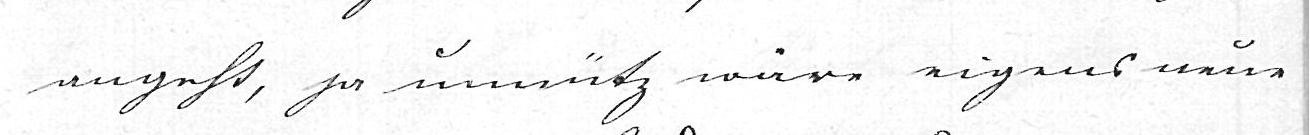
angeht, ja unnütz wäre eigens neue
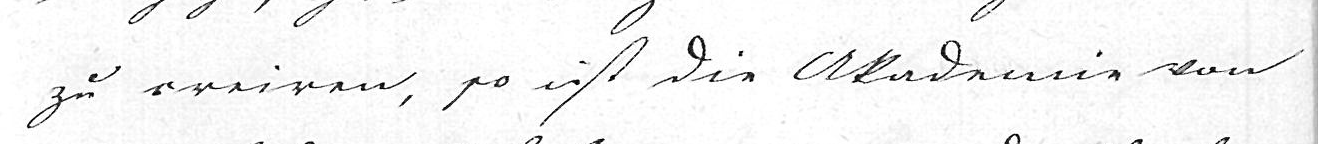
zu creiren, so ist die Akademie von
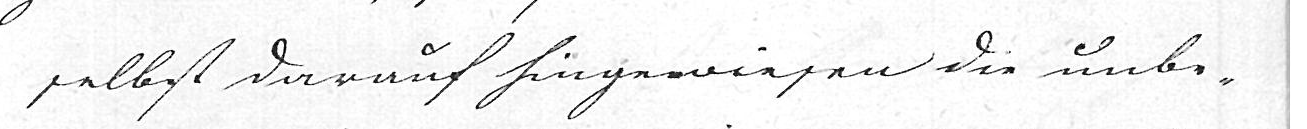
selbst darauf hingewiesen die unbe-
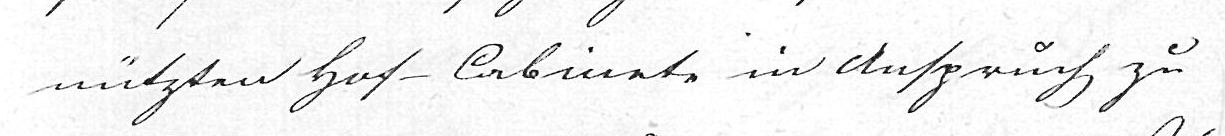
nützten Hof-Cabinete in Anspruch zu
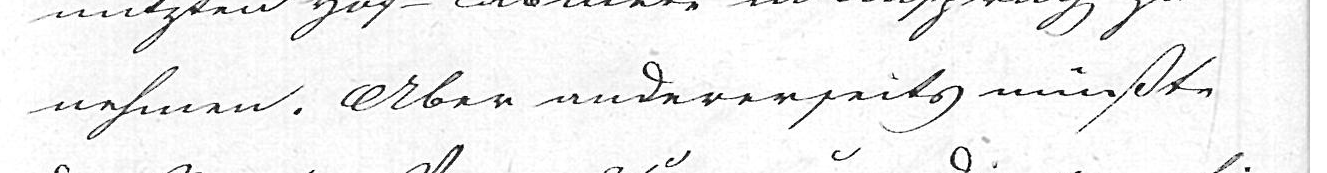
nehmen. Aber andererseits müßte
